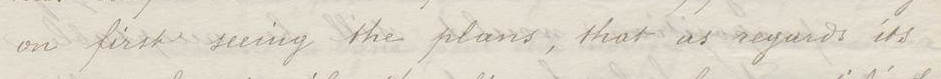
on first seeing the plans, that as regards its
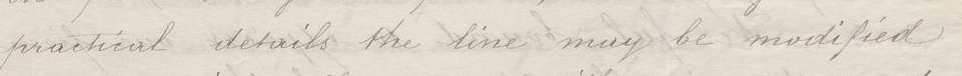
practical details the line may be modified
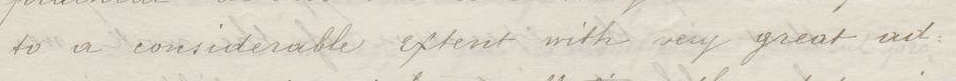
to a considerable extent with very great ad-
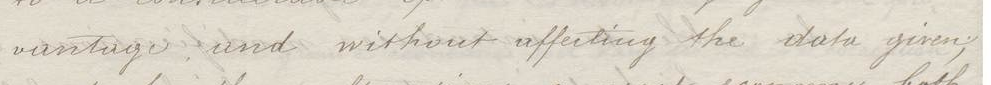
vantage and without affecting the data given;
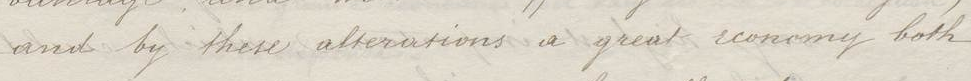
and by these alterations a great economy both
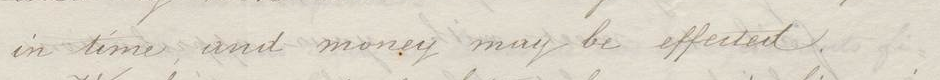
in time and money may be effected.
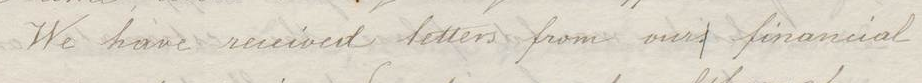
We have received letters from our financial
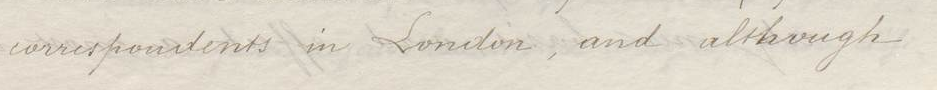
correspondents in London, and although
